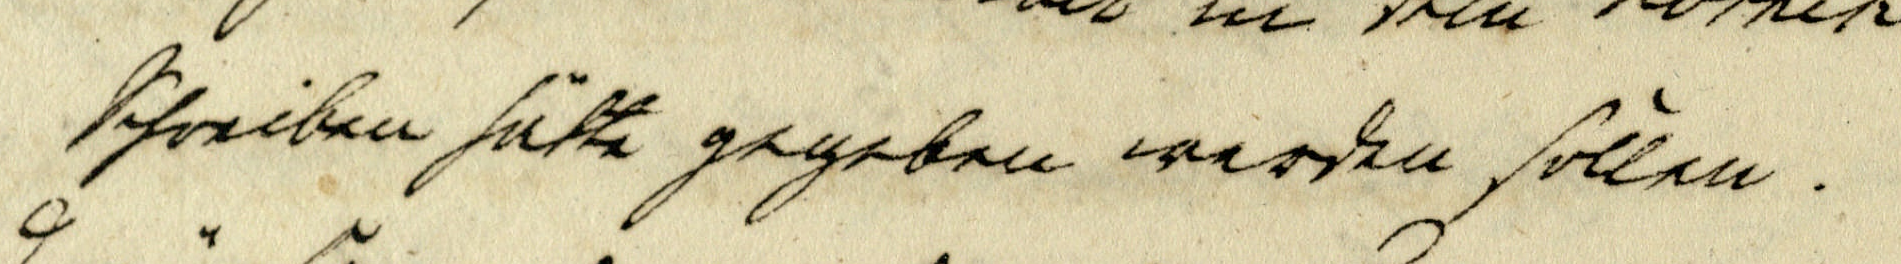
Schreiben hätte gegeben werden sollen.
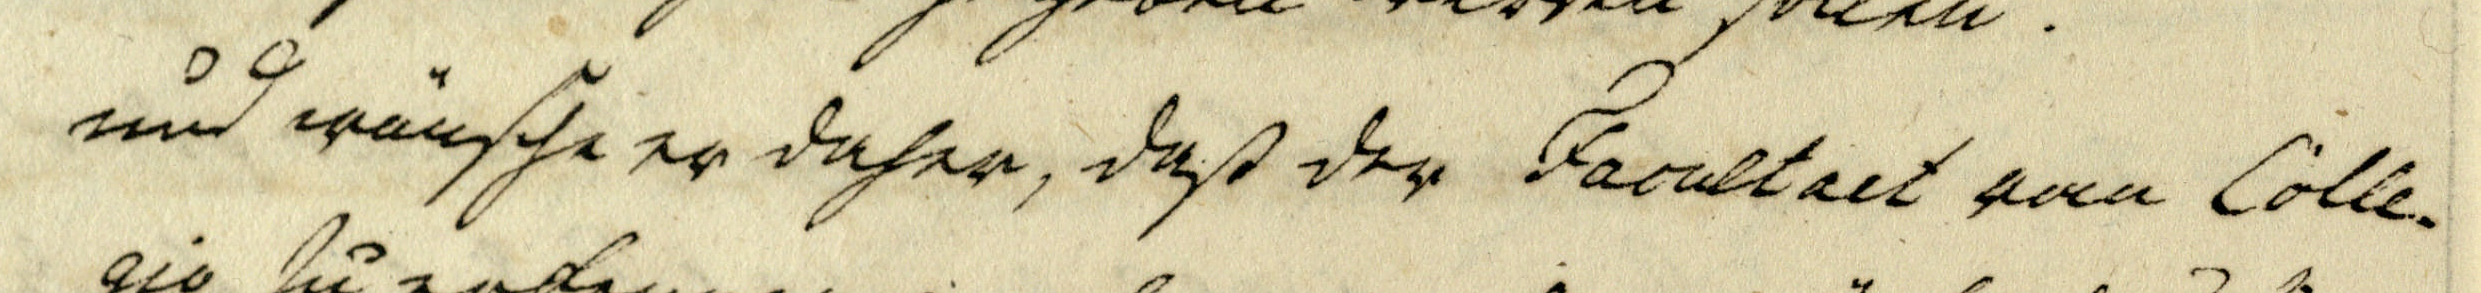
und wünsche er daher, daß der Facultaet vom Colle¬
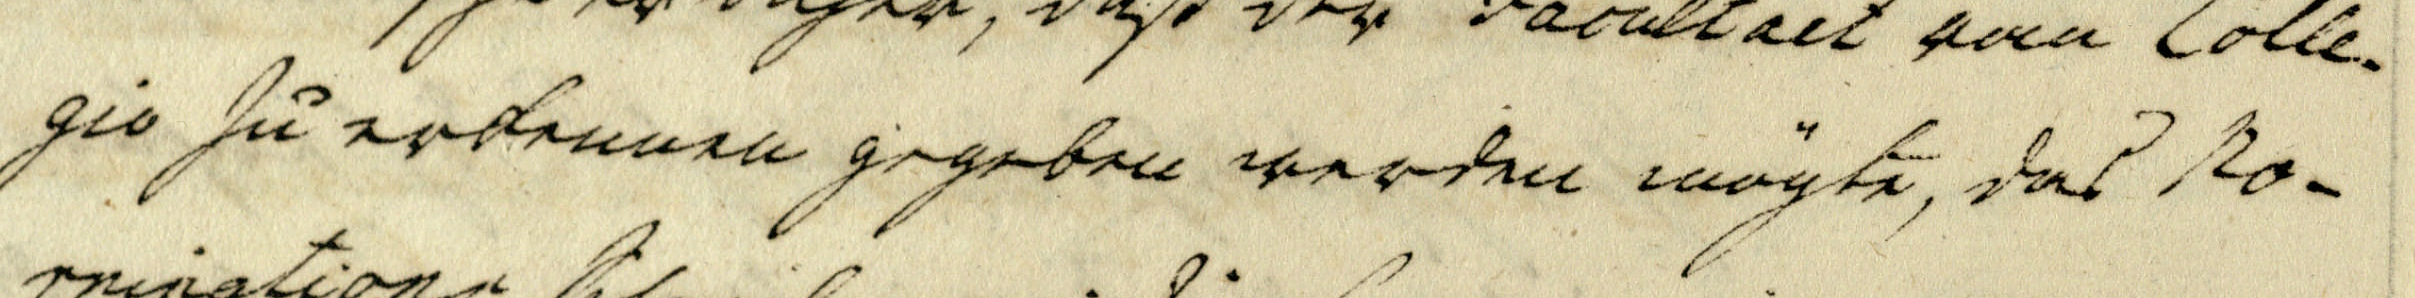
gio zu erkennen gegeben werden mögte, das No¬
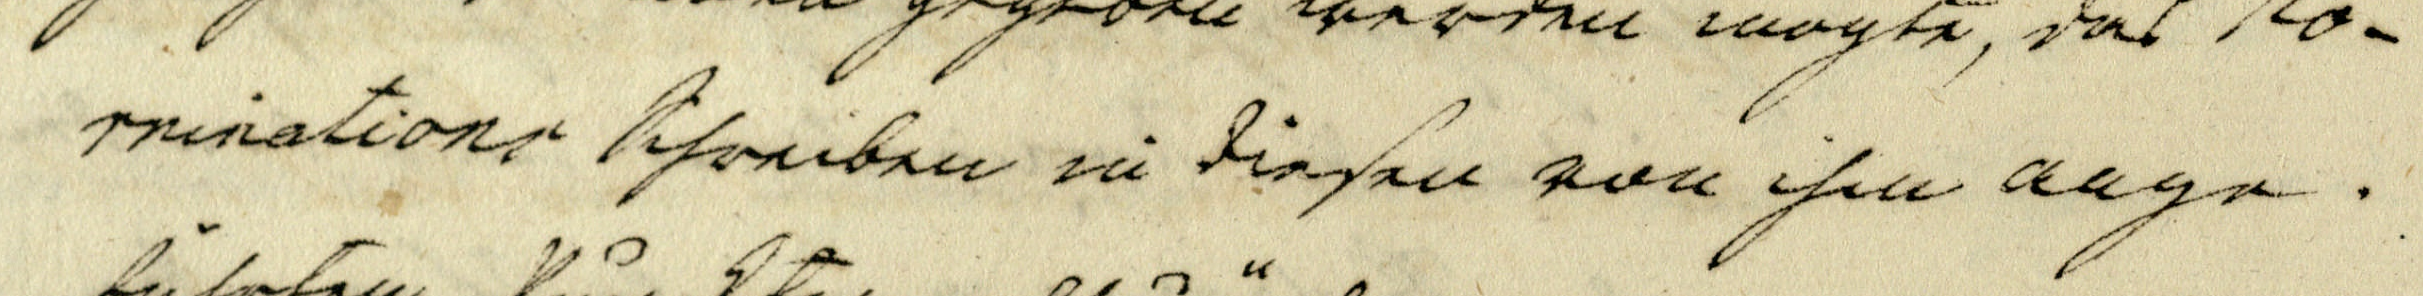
minations Schreiben in diesen von ihm ange¬
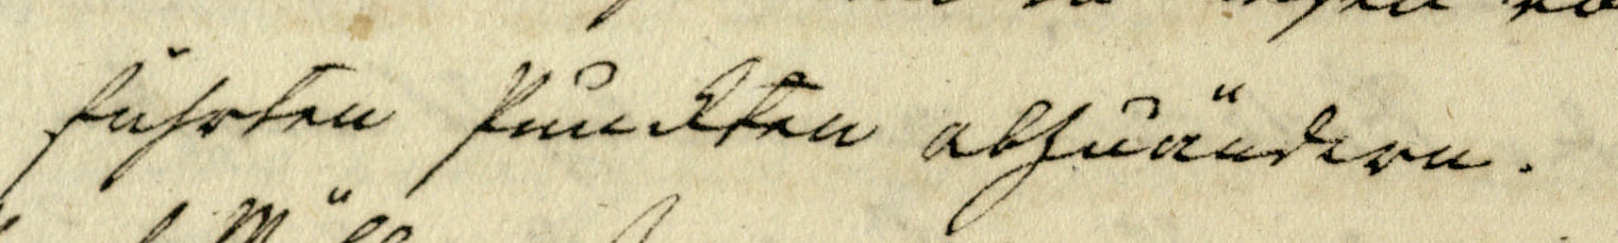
führten Punckten abzuändern.
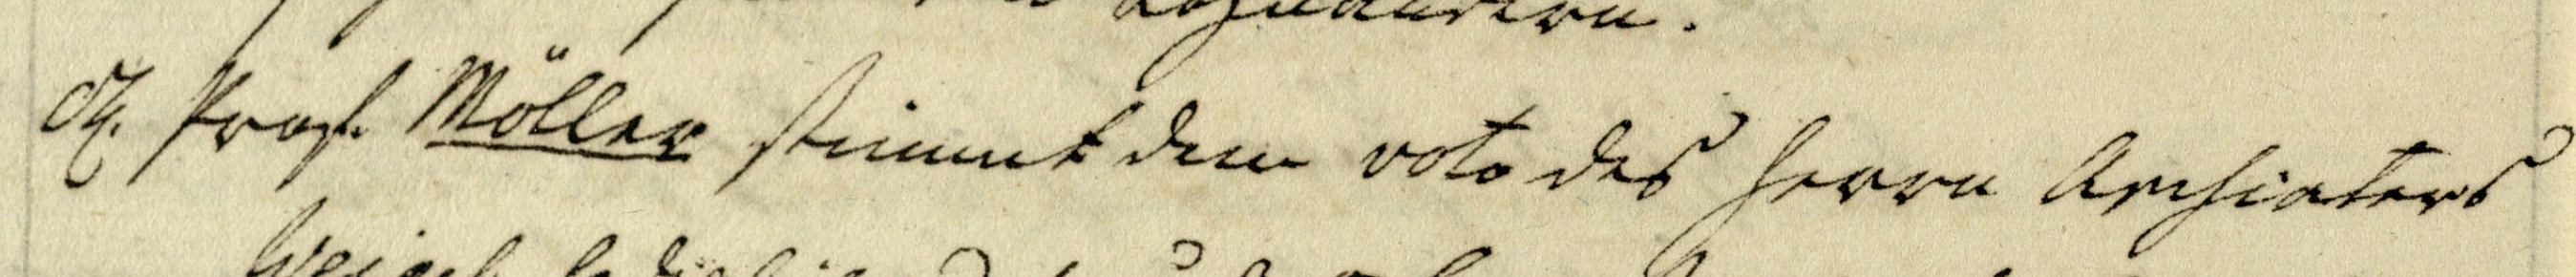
dh. Prof. Möller stimmt dem voto des Herrn Archiaters
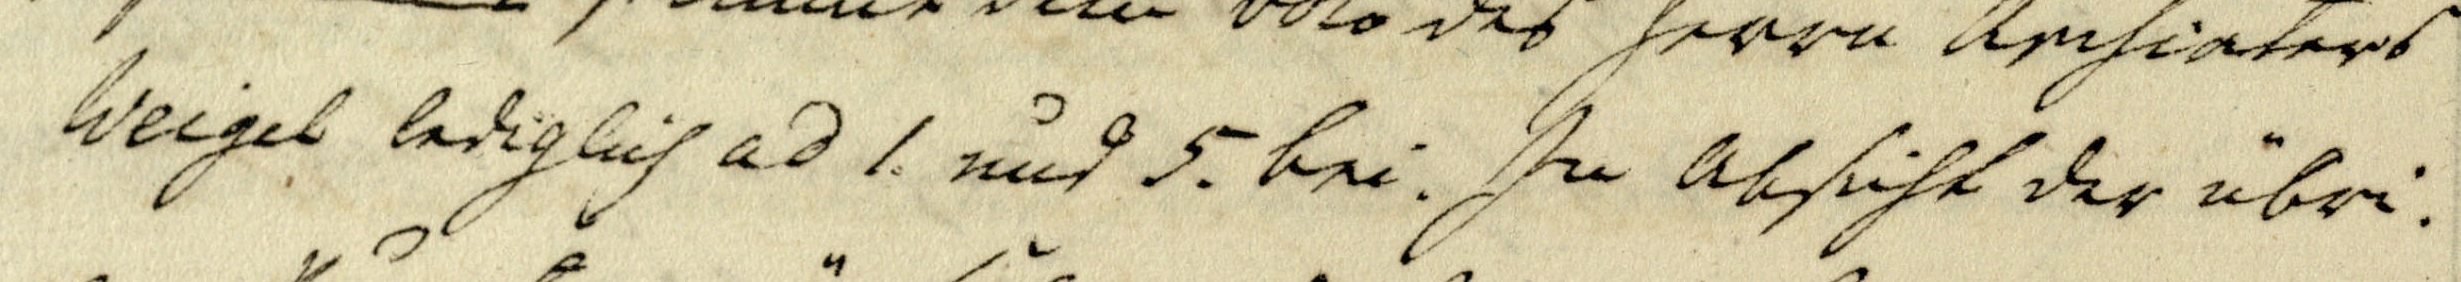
Weigel lediglich ad 1. und 5. bei. In Absicht der übri¬
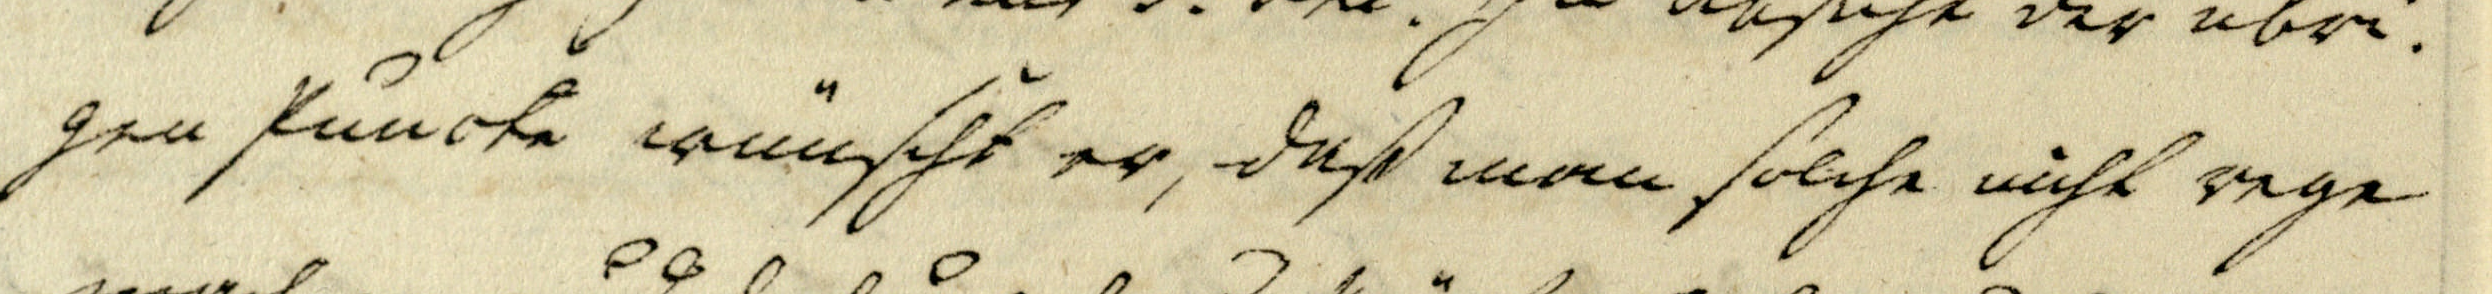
gen Puncte wünscht er, daß man solche nicht rege
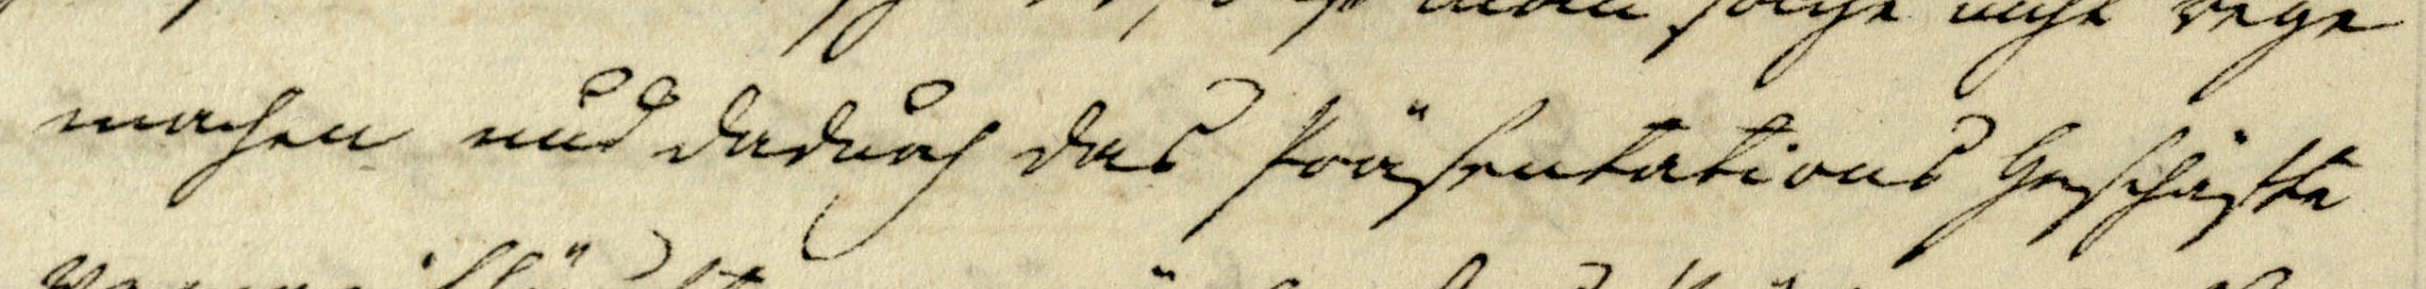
machen und dadurch das Präsentations Geschäfte
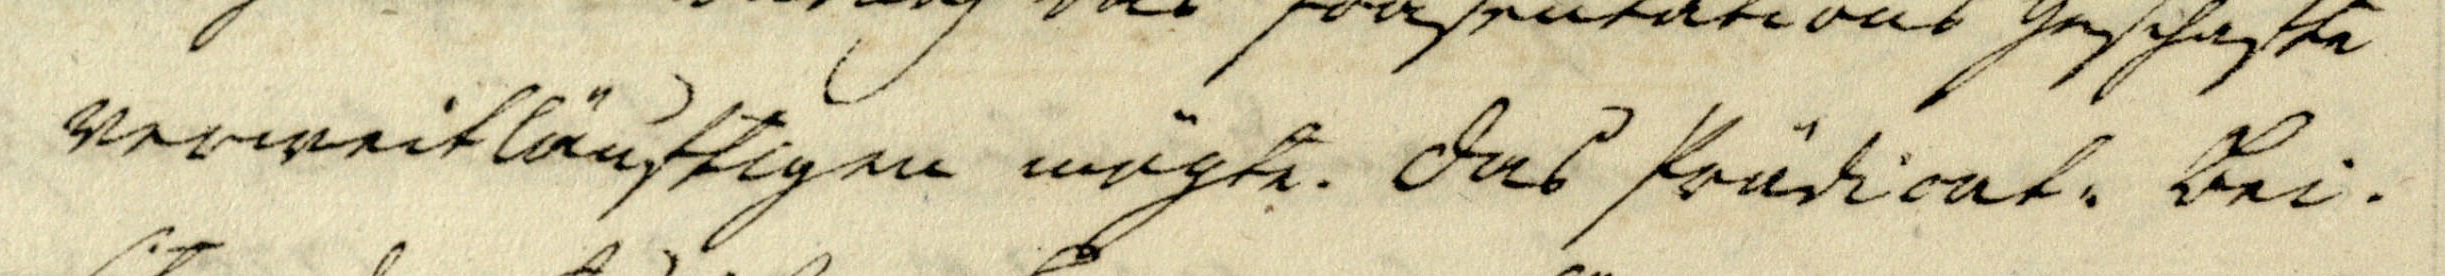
verweitläuftigen mögte. Das Prädicat: Bei¬
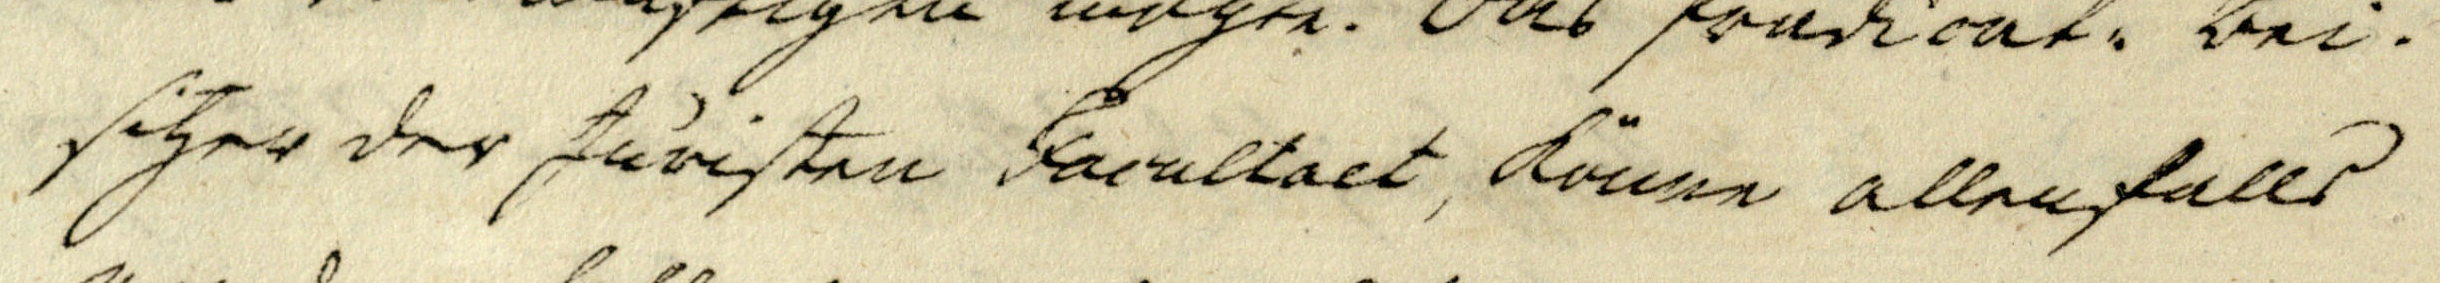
sitzer der Juristen Facultaet, könne allenfalls
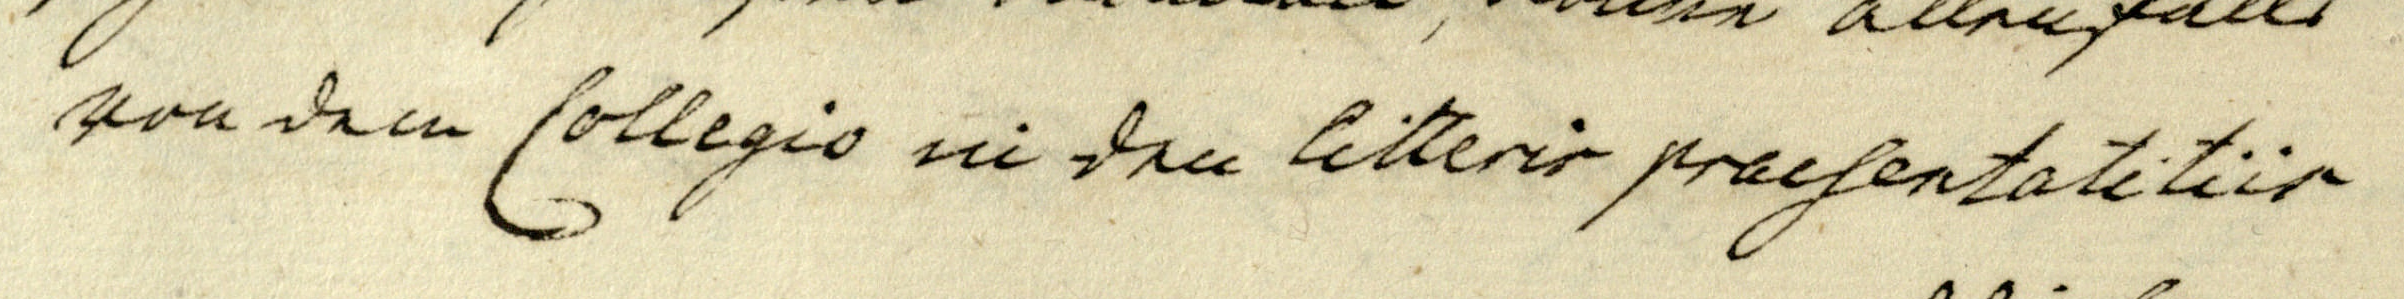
von dem Collegio in den litteris praesentatitiis
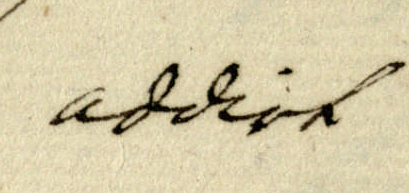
addirt
